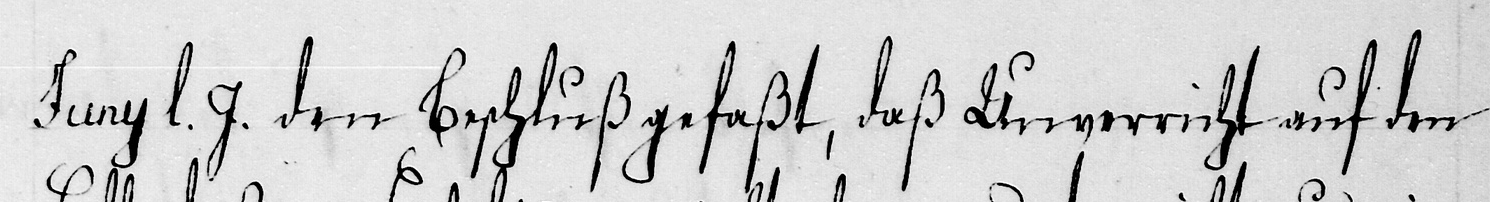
Juny l. J. den Beschluß gefaßt, daß Unverricht auf den
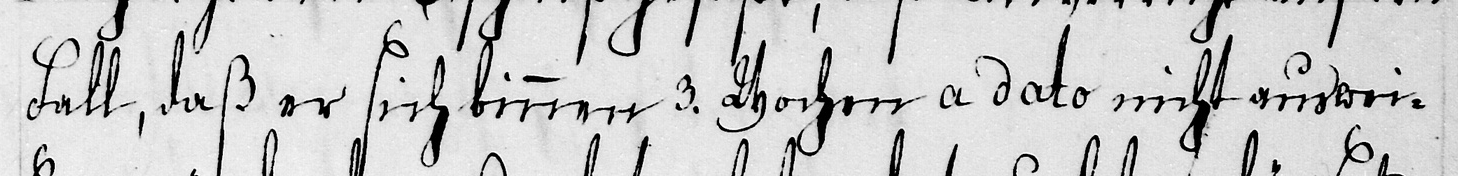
Fall, das er sich binnen 3. Wochen a dato nicht auswei¬
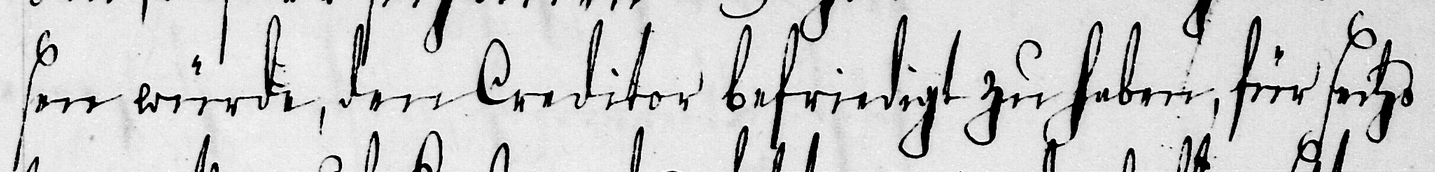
sen würde, den Creditor befriedigt zu haben, für sec¬
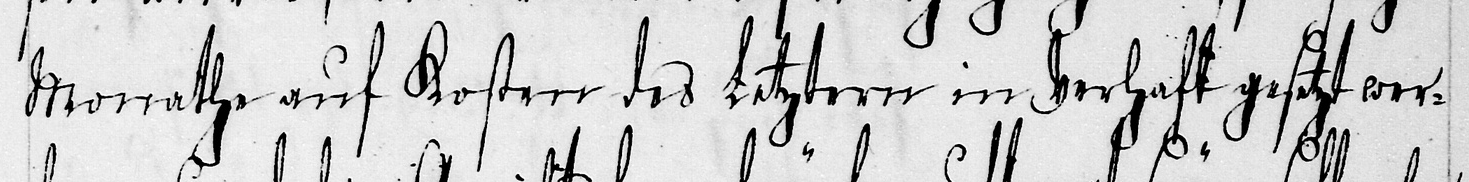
Monathe auf Kosten des Letztern in Verhaft gesetzt we¬
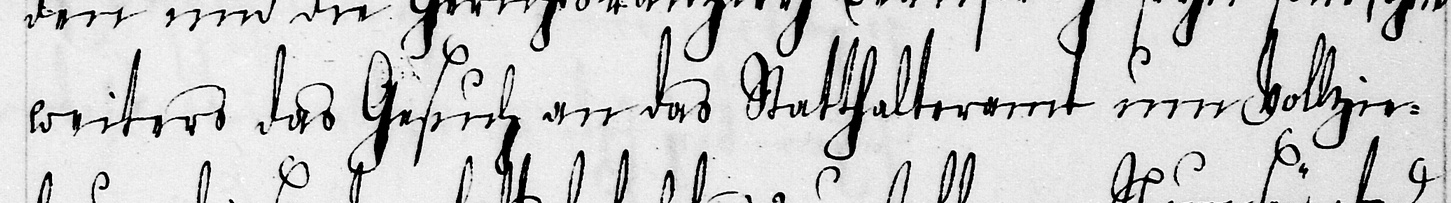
weiters das Gesuch an das Statthalteramt um Vollzie¬
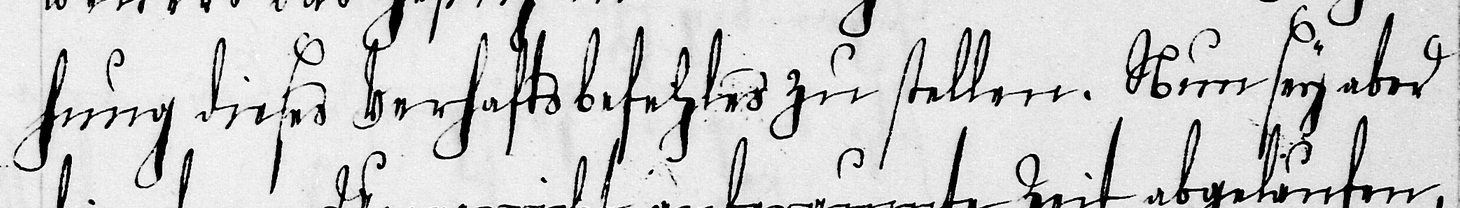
hung dieses Verhaftsbefehles zu stellen. Nun sey aber
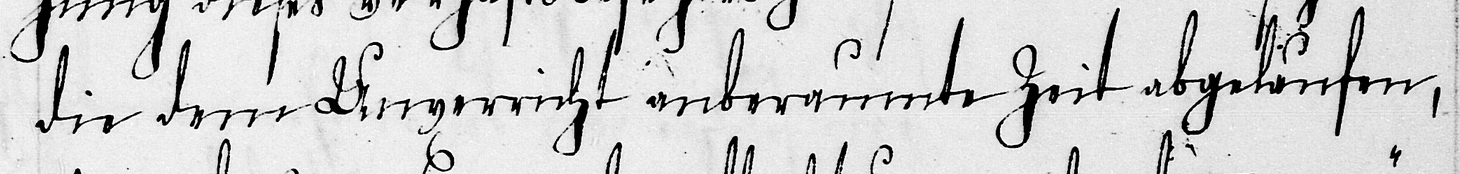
die dem Unverricht anberaumte Zeit abgelaufen,
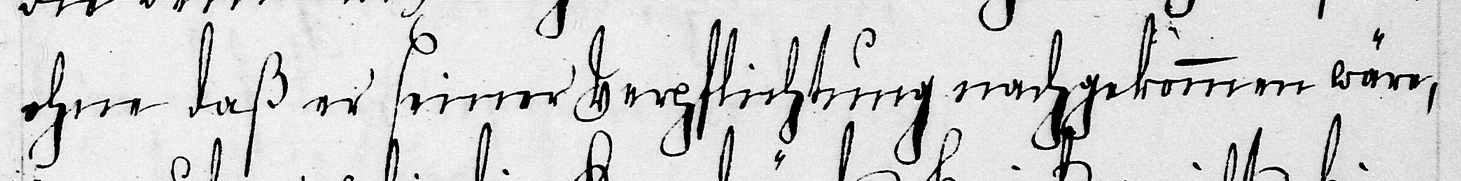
ohne daß er seiner Verpflichtung nachgekommen wäre,
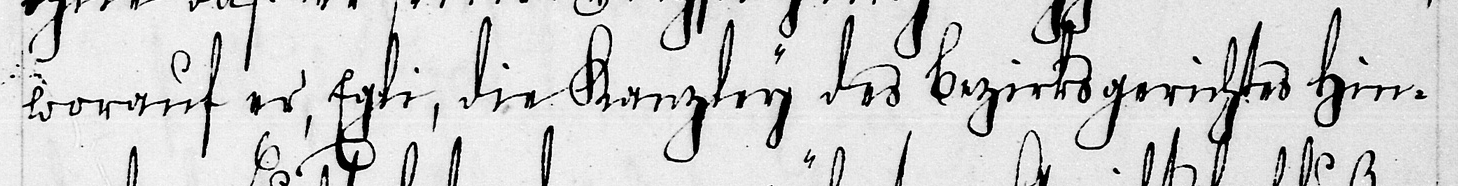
worauf er, Egli, die Kanzley des Bezirksgerichtes Hin¬
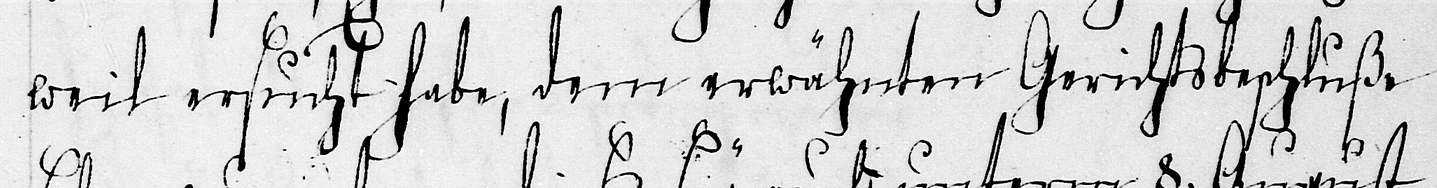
weil ersucht habe, dem erwähnten Gerichtsbeschluße
